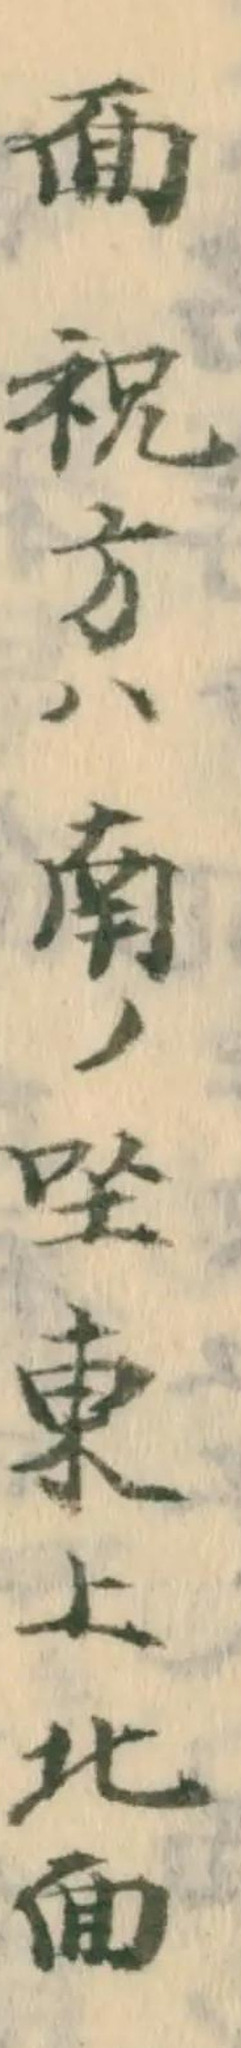面祝方ハ南ノ坐東上北面
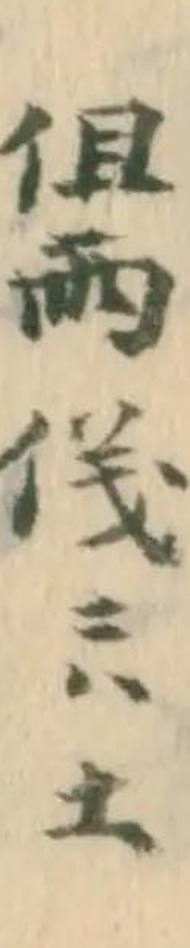但雨儀ニハ土
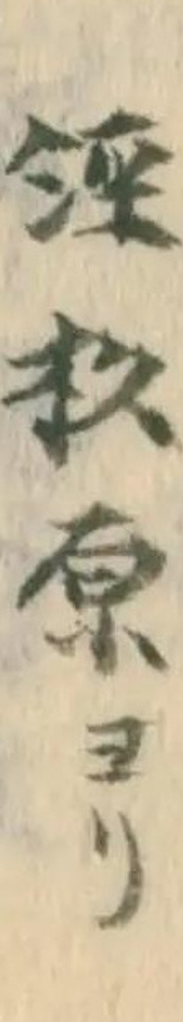ハ経杉原ヨリ

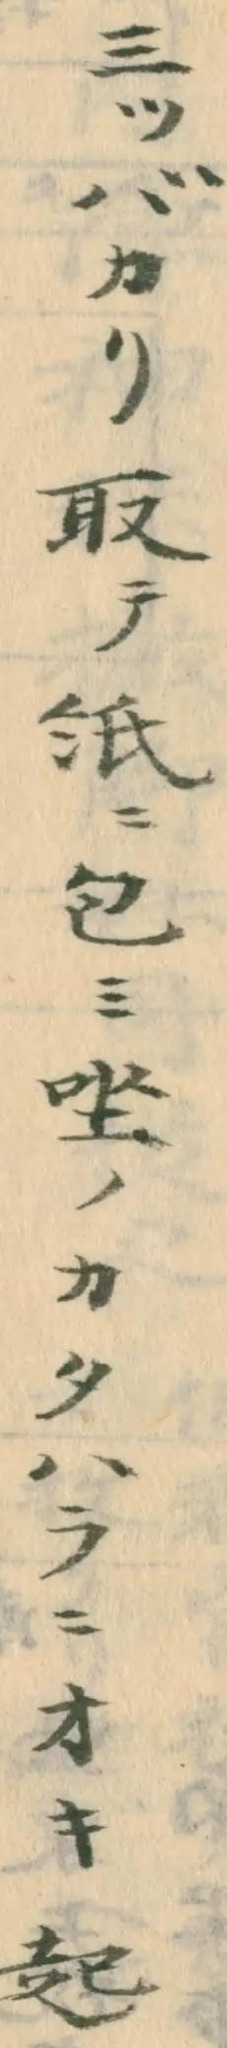三ツバカリ取テ紙ニ包ミ坐ノカタハラニオキ起
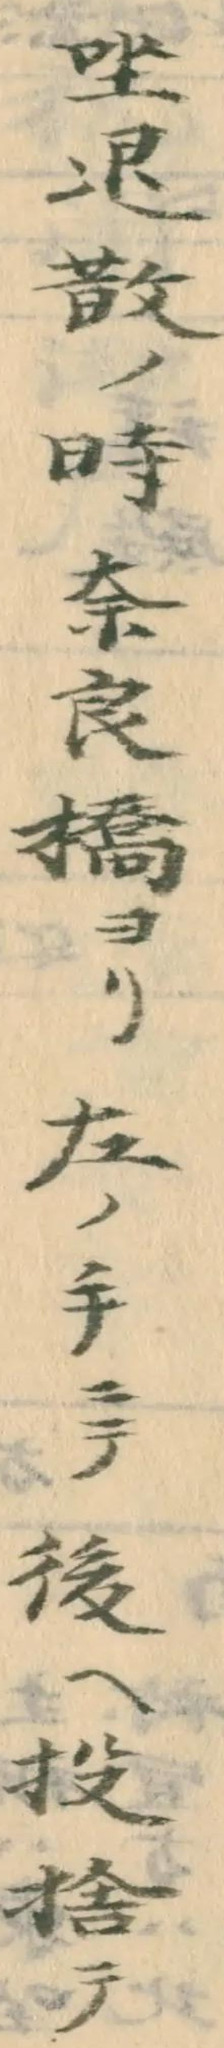坐退散ノ時奈良橋ヨリ左ノ手ニテ後ヘ投捨テ
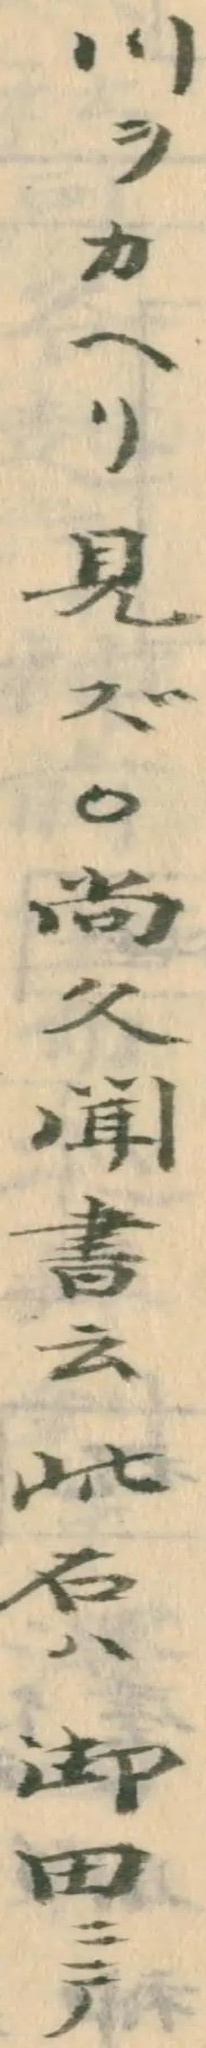川ヲカヘリ見ズ○尚久聞書云此石ハ御田ニテ
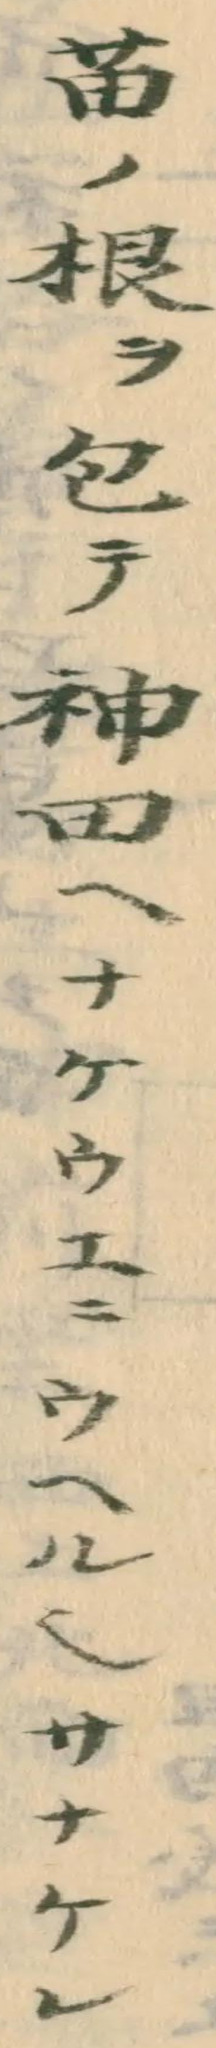苗ノ根ヲ包テ神田ヘナケウエニウヘル也サナケレ
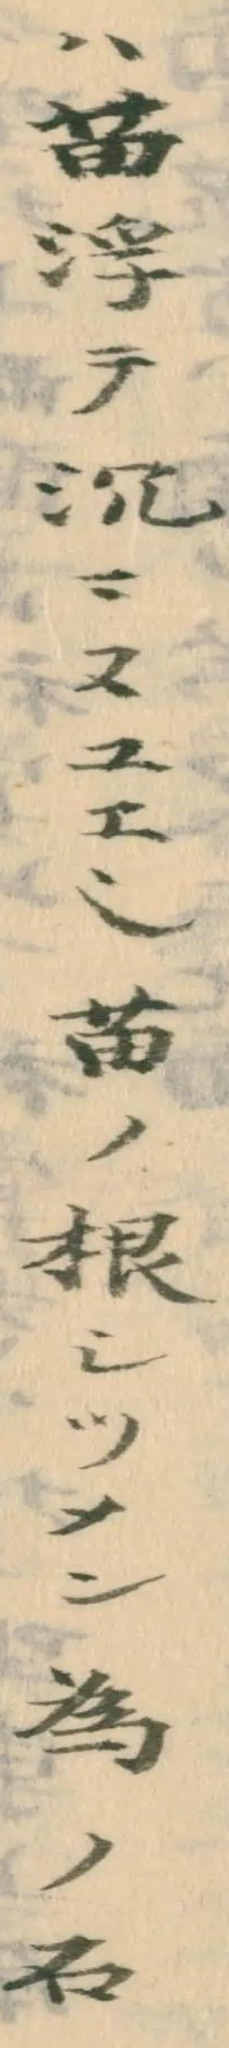ハ苗浮テ沈マスユヱ也苗ノ根シツメン為ノ石
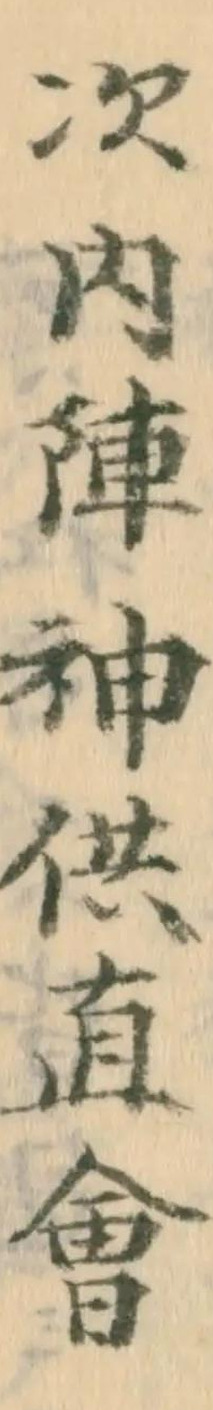次内陣神供直会
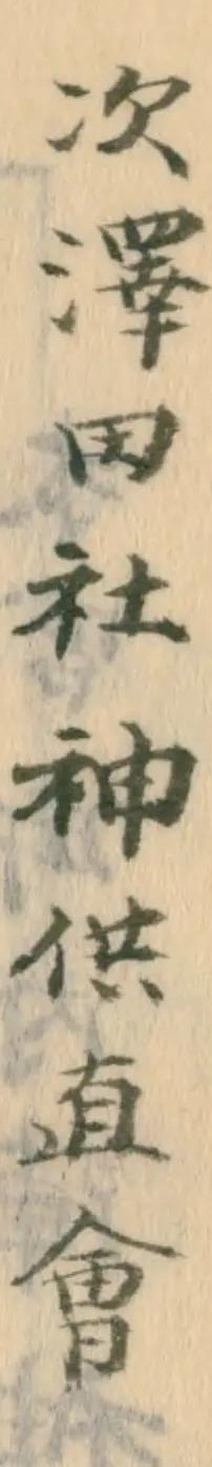次内陣神供直会
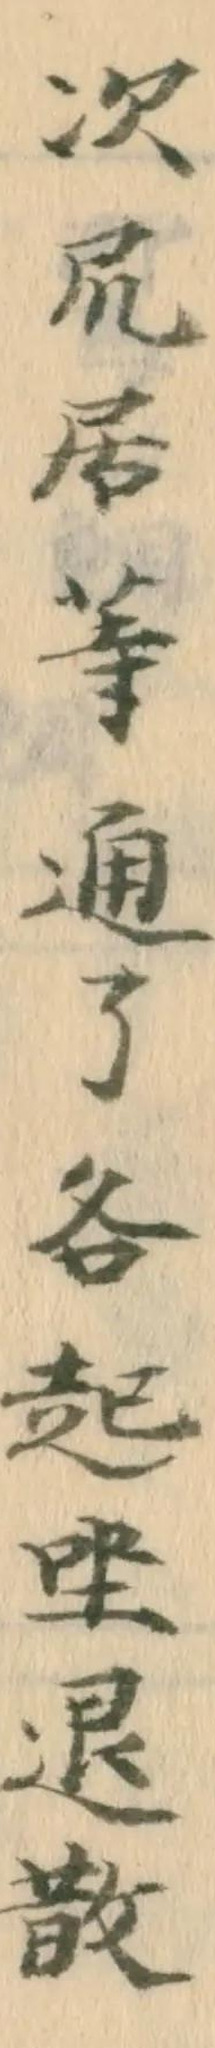次尻等通了各起坐退散
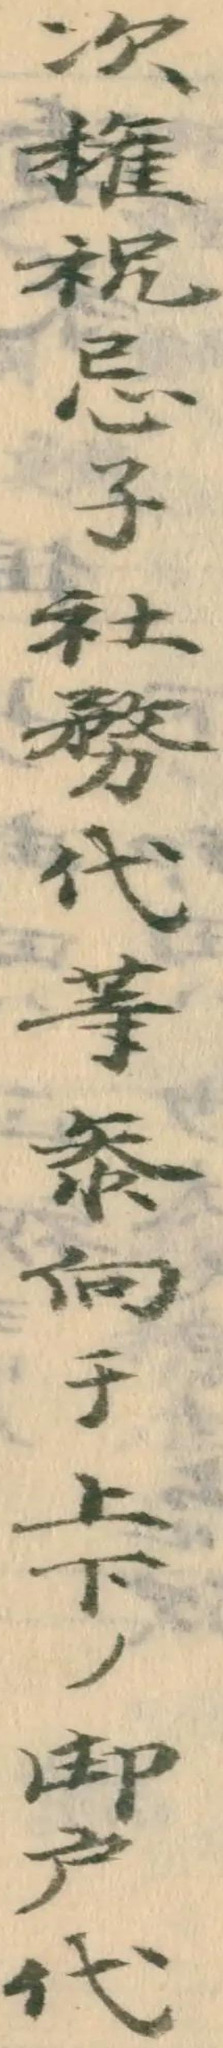次権祝忌子社務代等参向于上下ノ御戸代
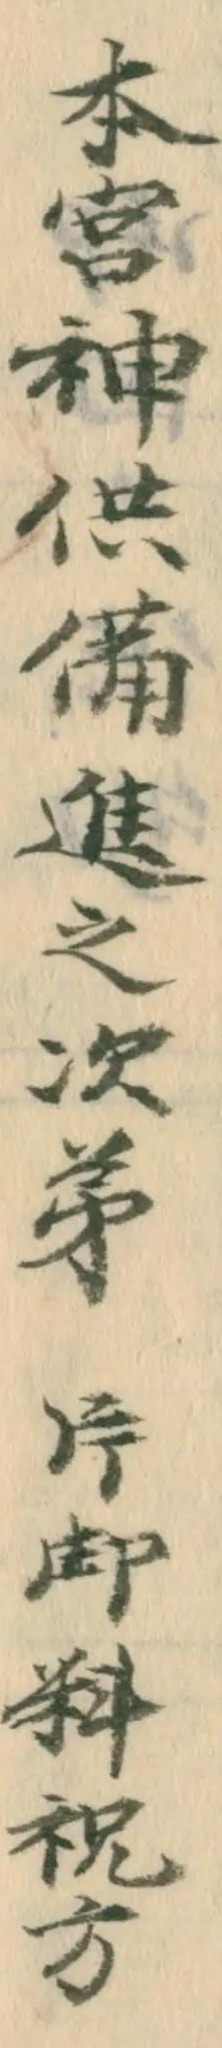本宮神供備進之次第片御料祝方

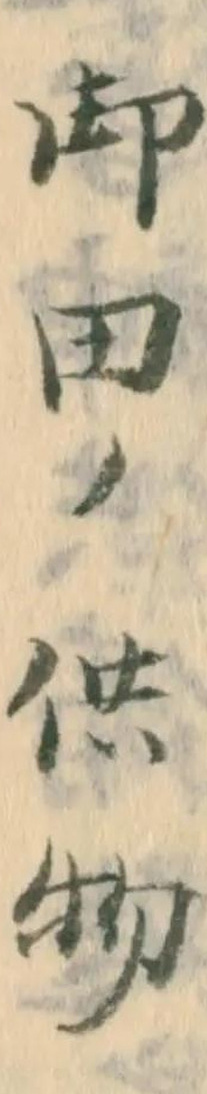御田ノ供物
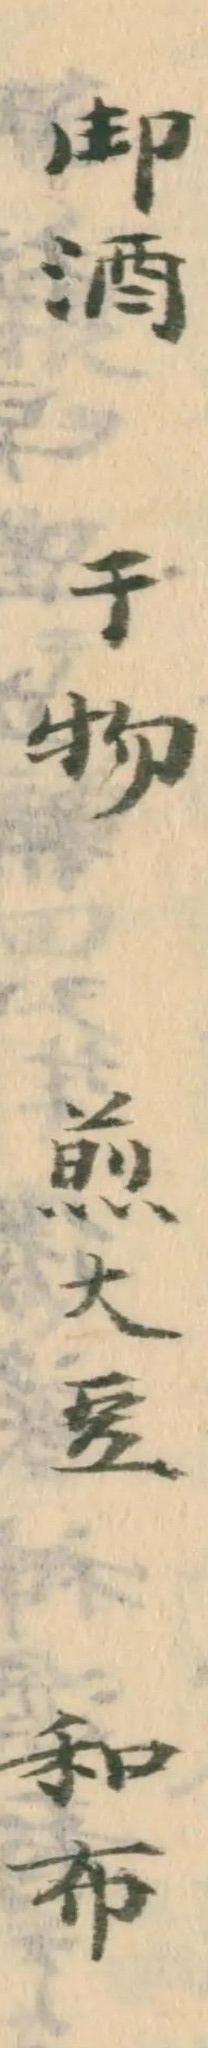御酒干物煎大豆和布
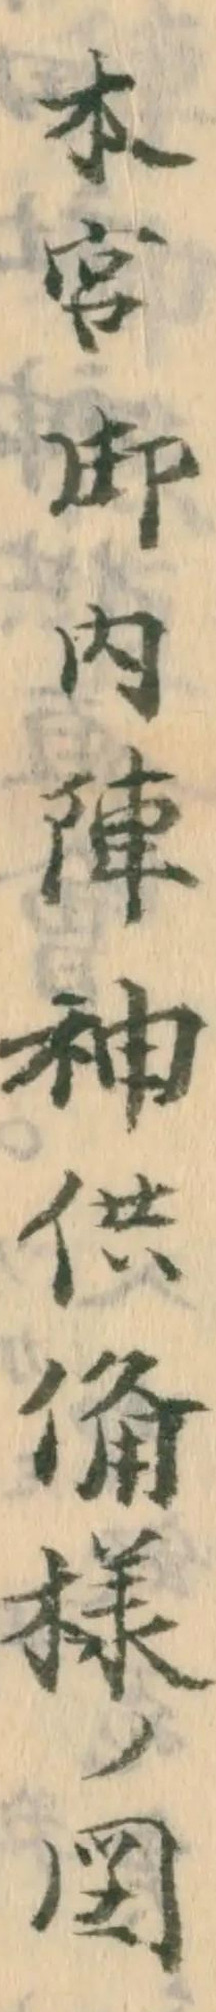本宮御内陣神供備様ノ図
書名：賀茂社記録. 第5冊
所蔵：国立国会図書館 National Diet Library, JAPAN
